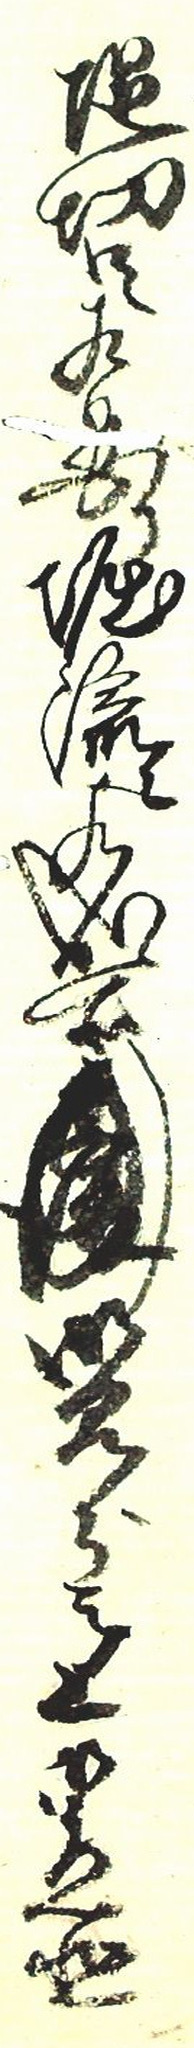堤切口へ相当り堀流に相成候所御見分之上御慈悲
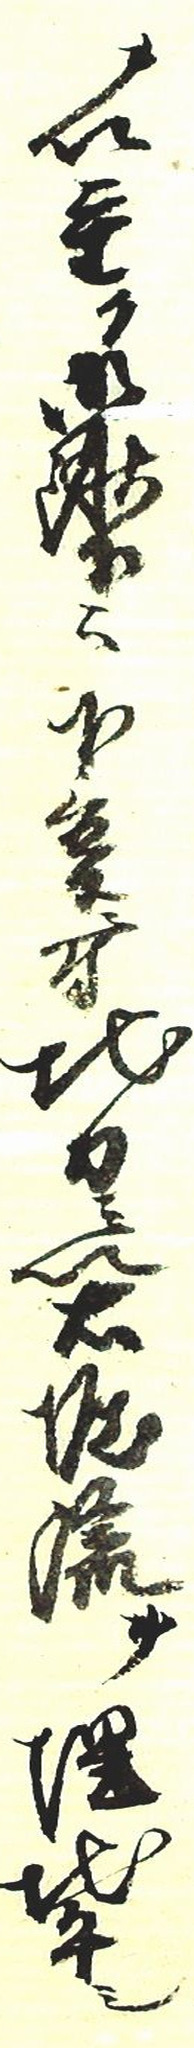を以重く御鍬下被下置候に付地力を以右堀流を埋地平し
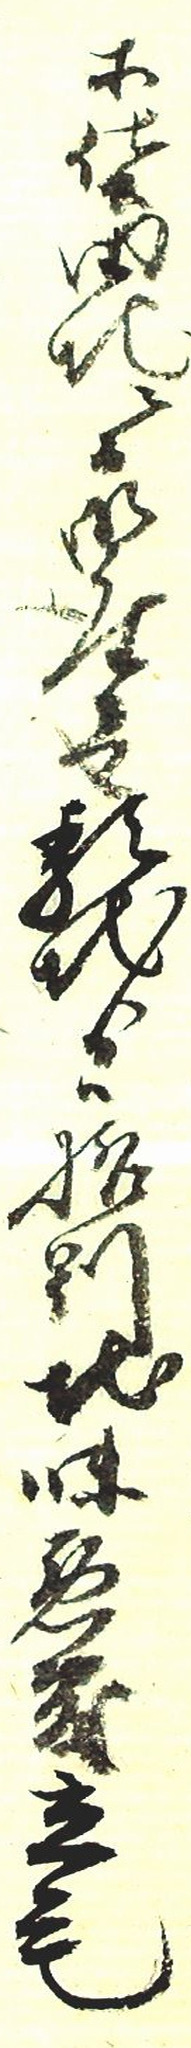等仕候田地にて御座候類地ゟは格別地味悪敷立毛
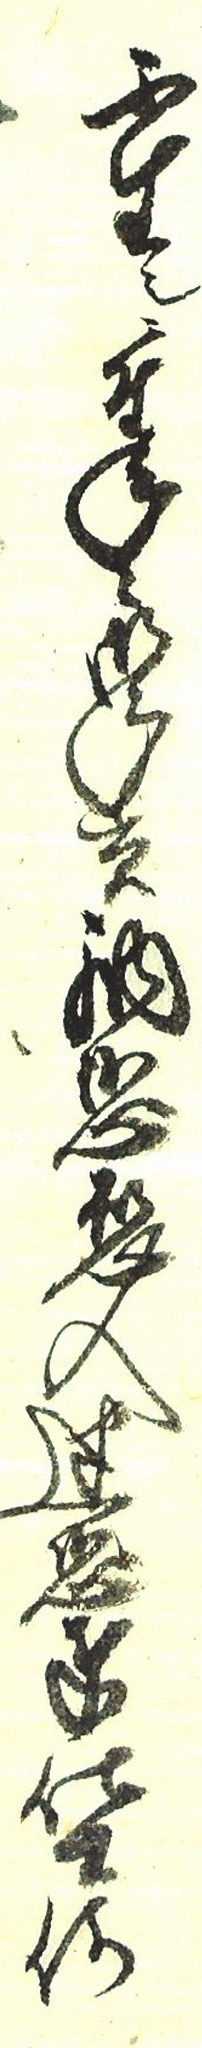不生しに付年々御年貢納恐想入迷惑奉仕候何
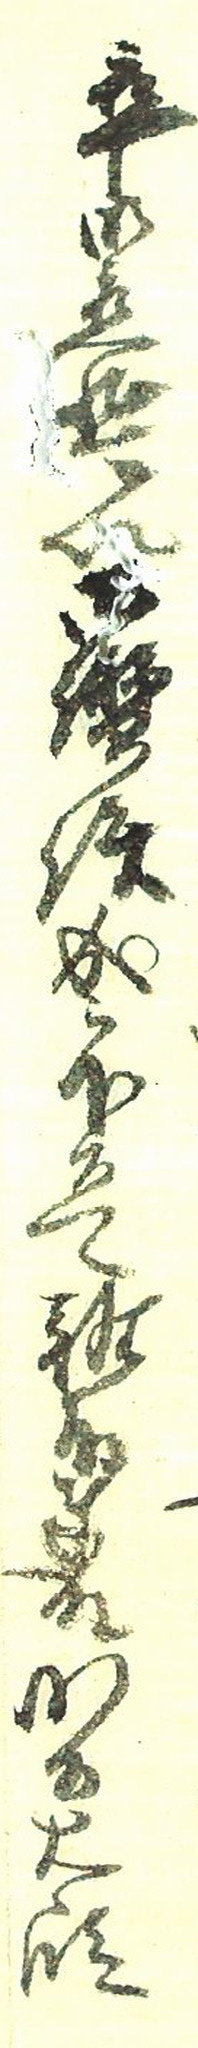卒御慈悲を以御讃談成被下候はゝ難有奉存候仍て右之段
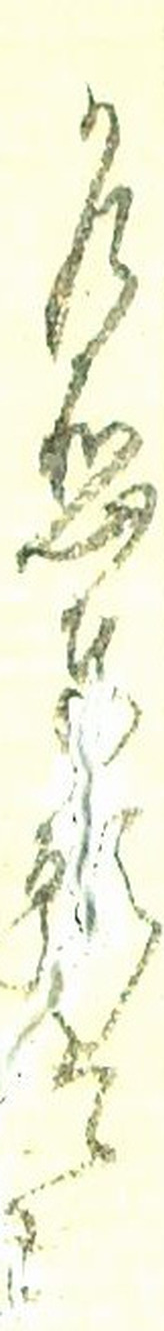乍恐奉願上候以上
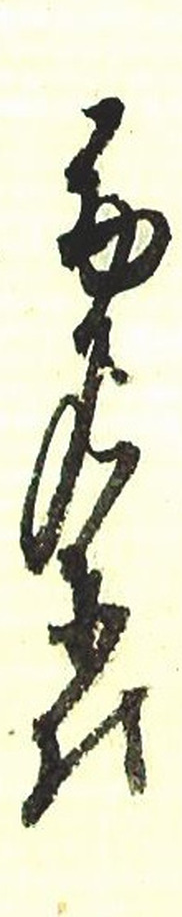西名東村
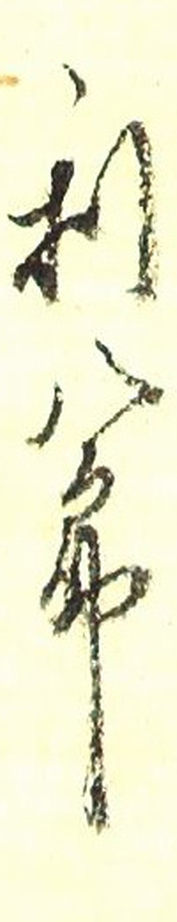利八郎
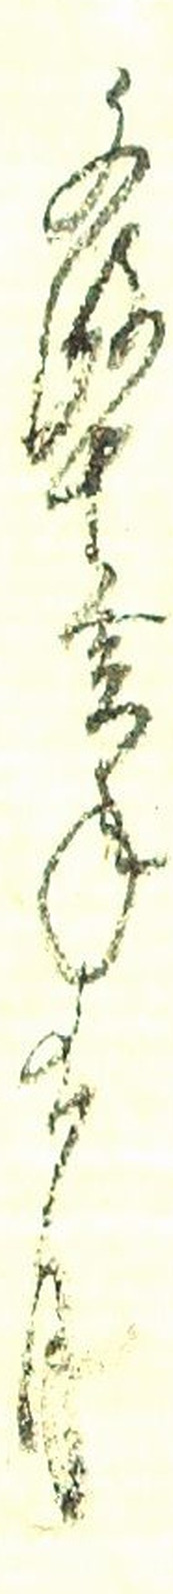文政十亥年十一月
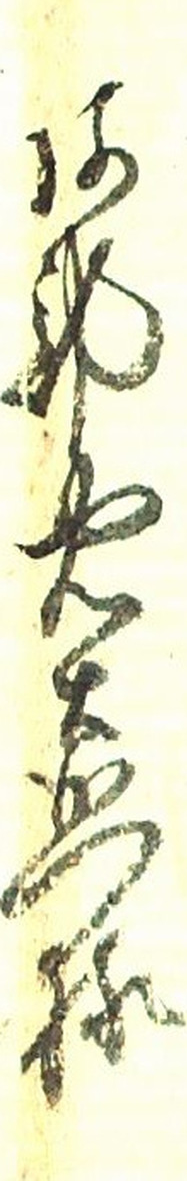阿部忠右衛門様
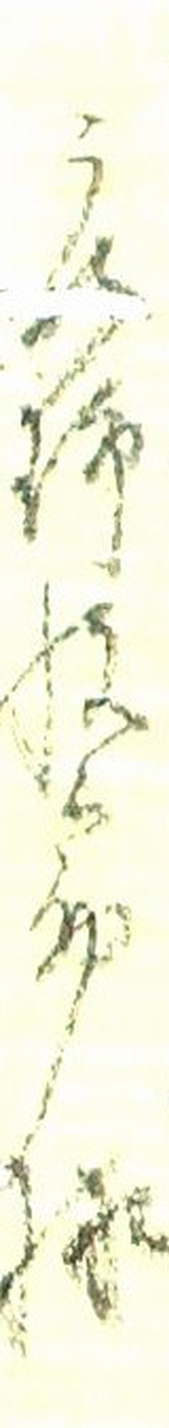庄野悦次郎様
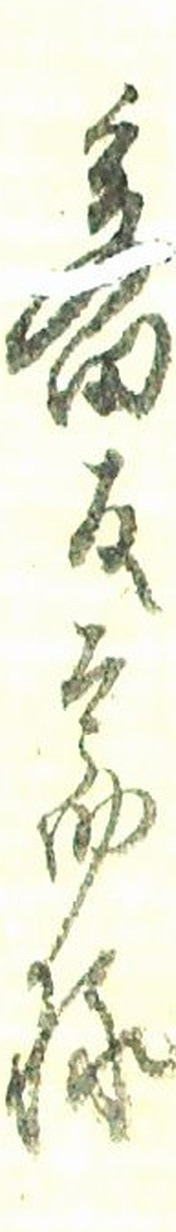多田友二郎様

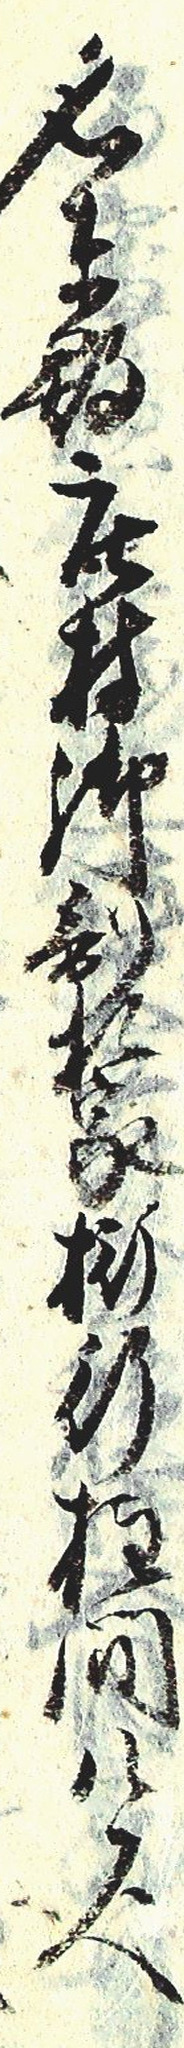名東郡庄村御制札家桁行柱間八尺
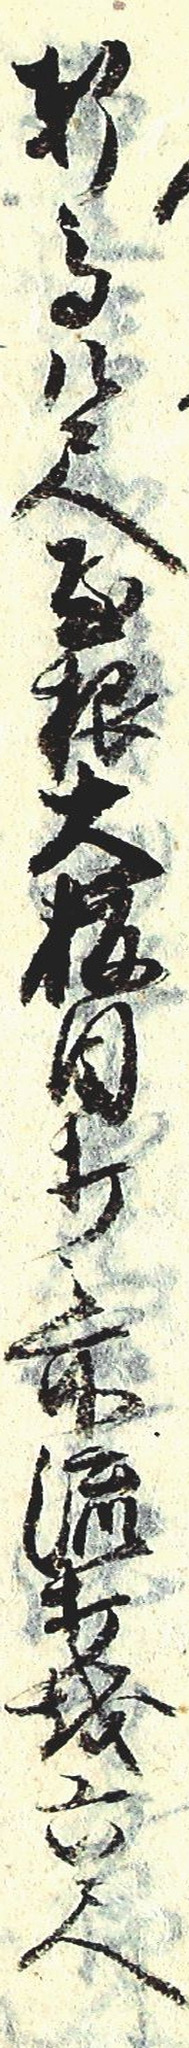軒高八尺屋根大板目打之所流打越六尺
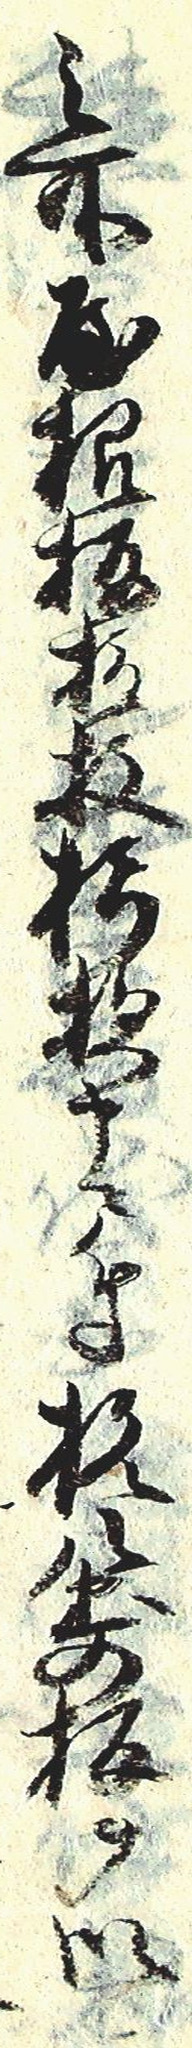之所屋根板拾枚折損申に付杉八歩板を以
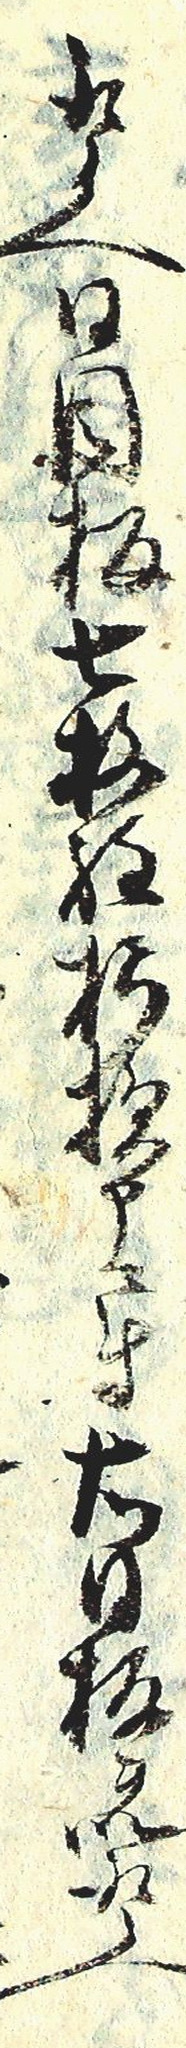取かへ同目板七枚程折損申に付右同板を以取かへ
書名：諸御願書控(弐番）
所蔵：鳴門教育大学 Naruto University of Education
